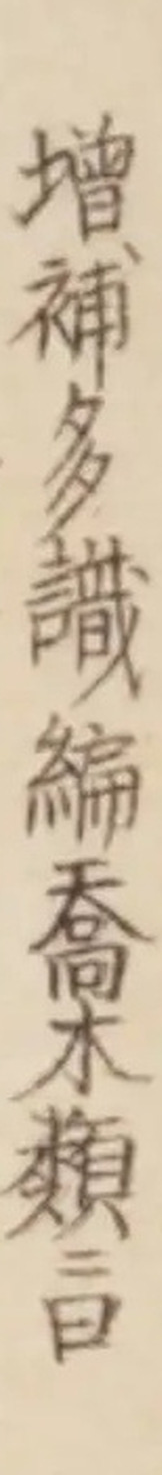増補多識編香木類に曰

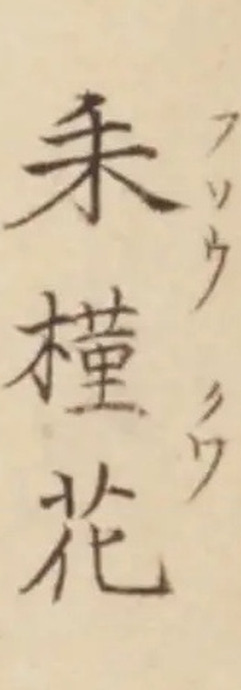耒槿花
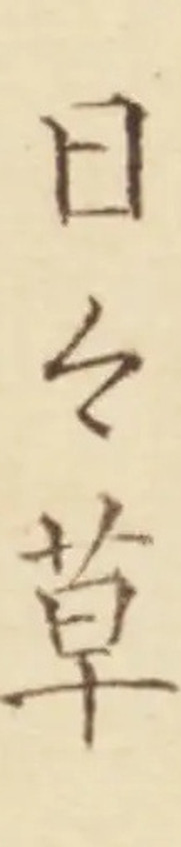日々草
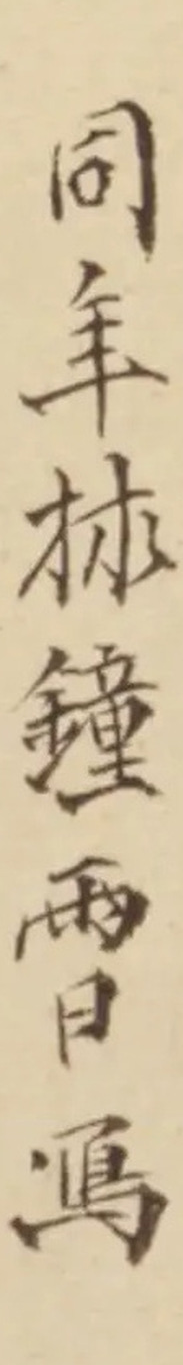同年林鐘雨日寫
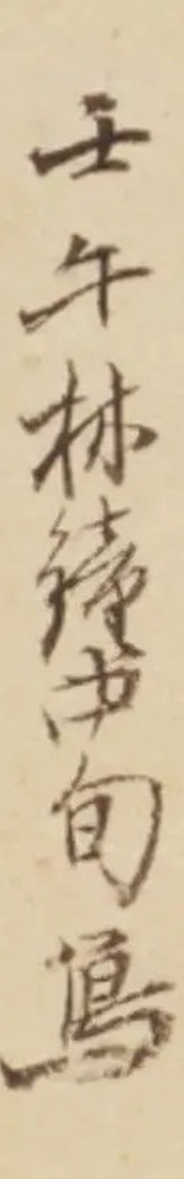壬午林鐘中旬寫
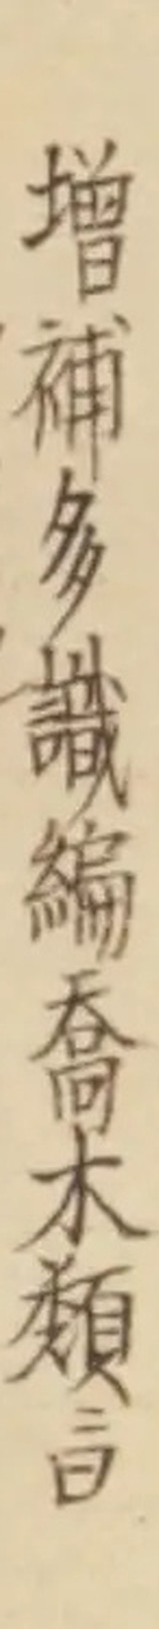増補多識編喬木類に曰

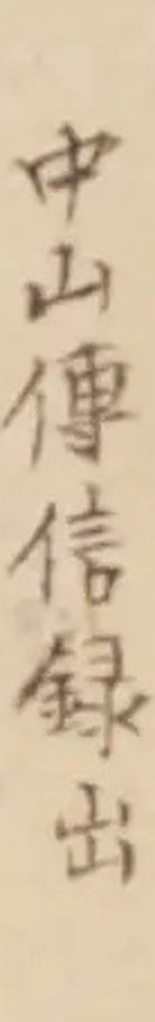中山傳信録出
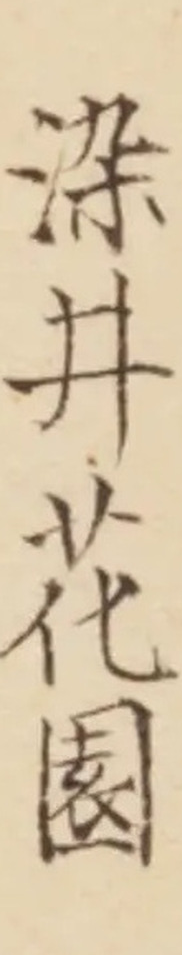染井花園
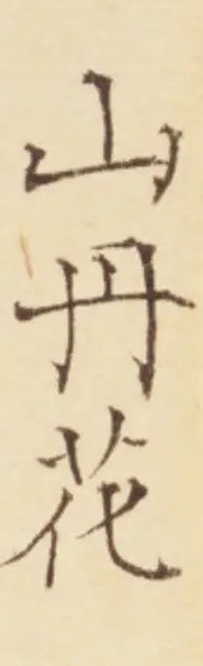散丹花
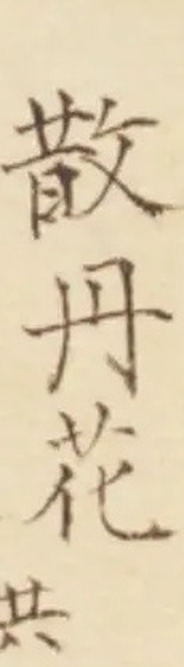散丹花
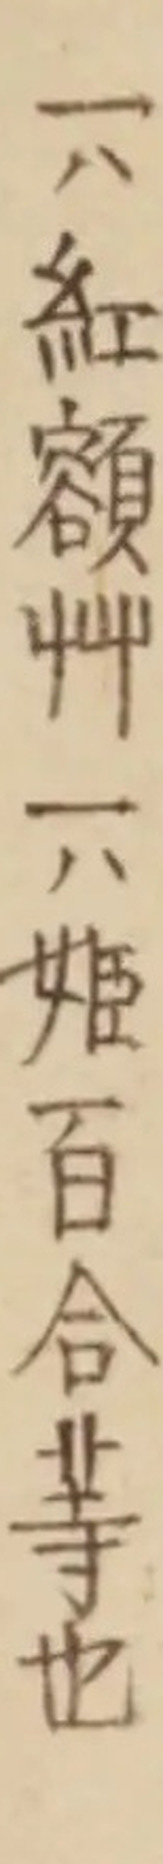一は紅額艸一は姫百合等也

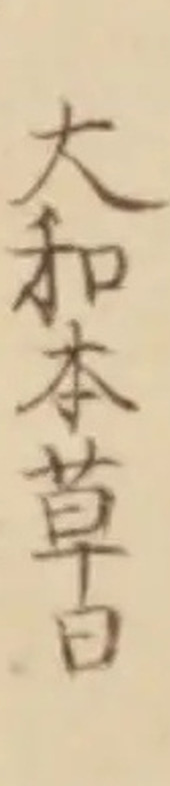大和本草曰
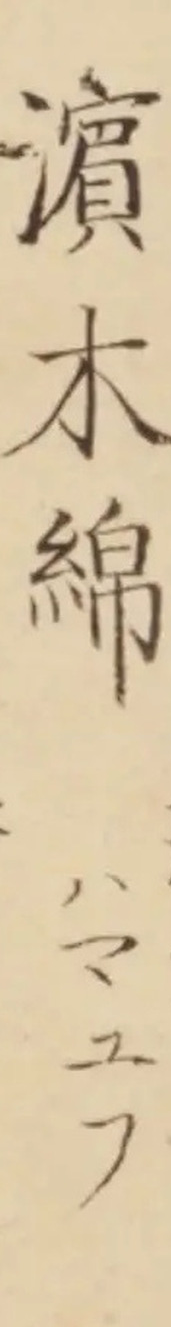濱木綿ハマユフ
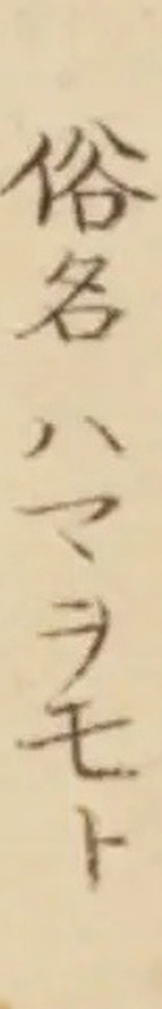俗名ハマオモト
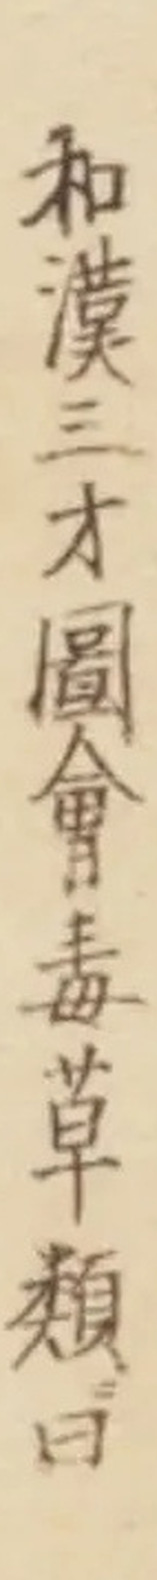和漢三才圖會毒草類に曰
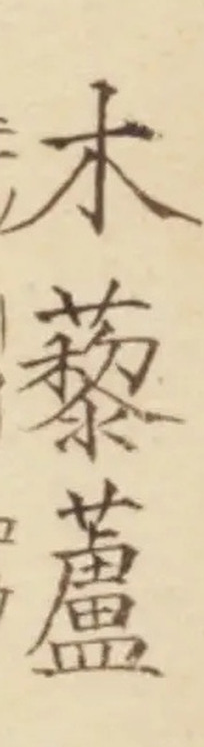木藜蘆
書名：梅園草木花譜夏之部. 1
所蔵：国立国会図書館 National Diet Library, JAPAN
